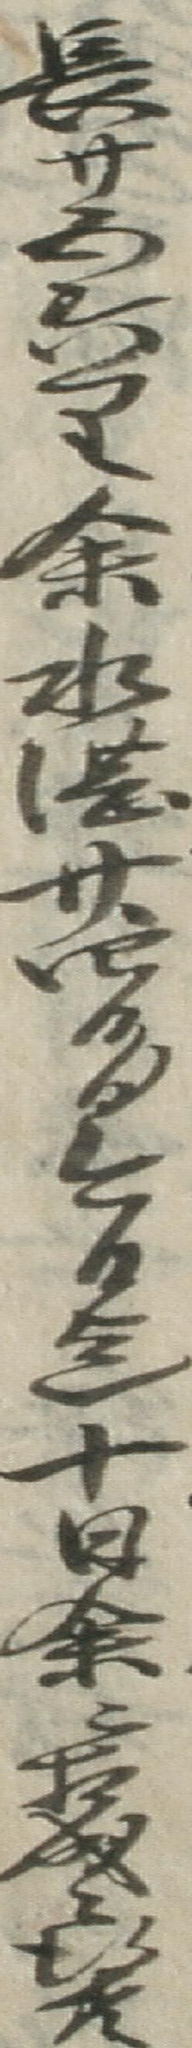長サ五六里余水湛廿四日ゟ今日迄十日余二相成候得共
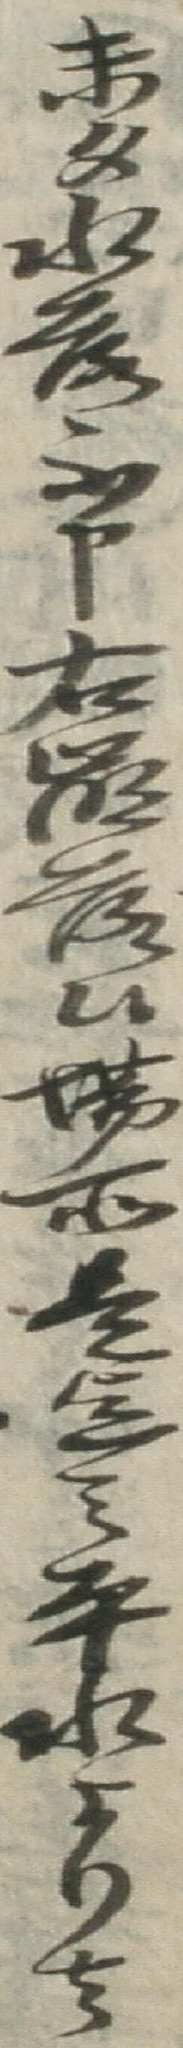未タ水落不申右崩落候場所是迄之平水よりは
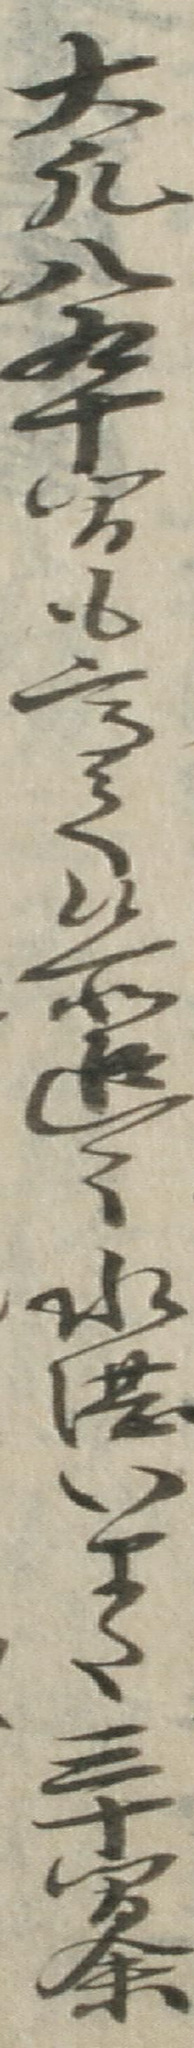大凡八九十間も高く候所追々水湛いまた三十間余
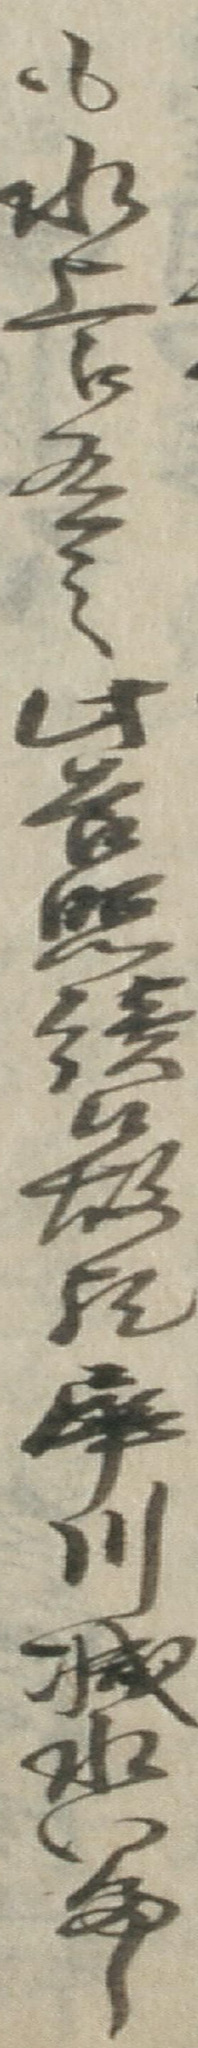も水上江有之此節照続候故歟犀川減水いたし
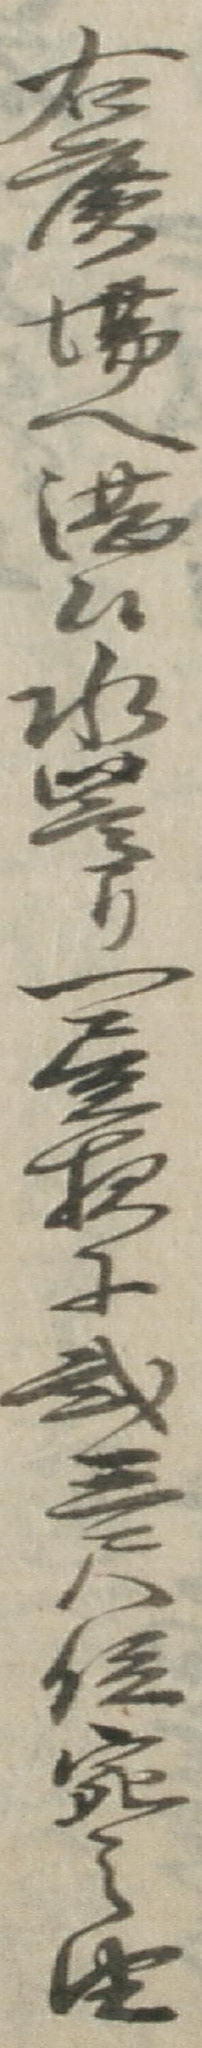右広場へ湛候水嵩り一昼夜に弐三尺位宛之由
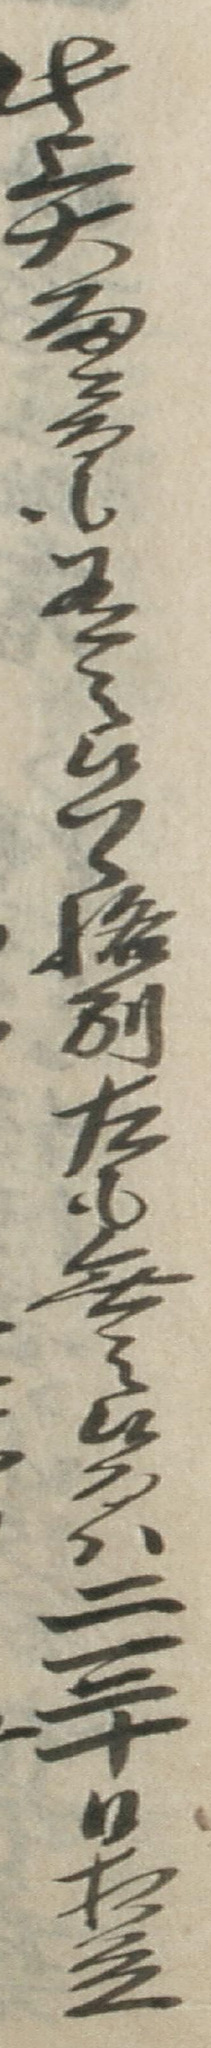此上大雨二而も有之候ハヽ格別左も無之候而ハ二三十日相立
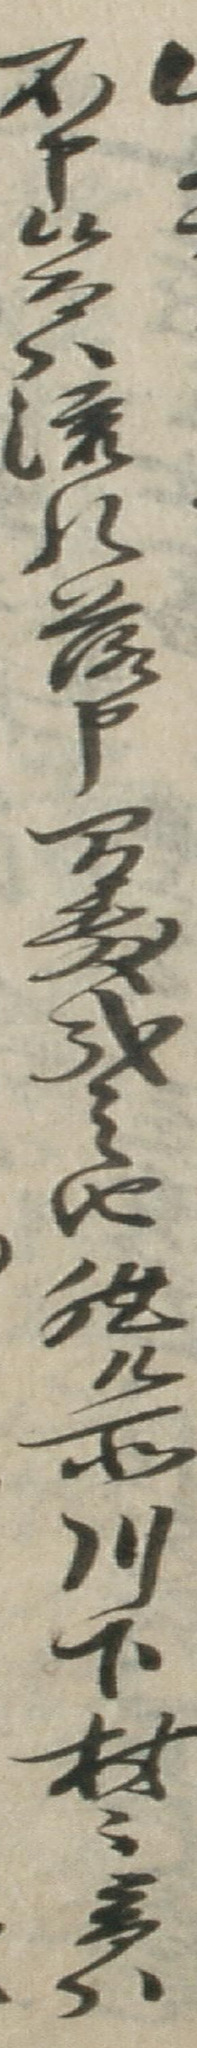不申候而ハ流れ落申間敷哉之由然ㇽ所川下村々二而ハ
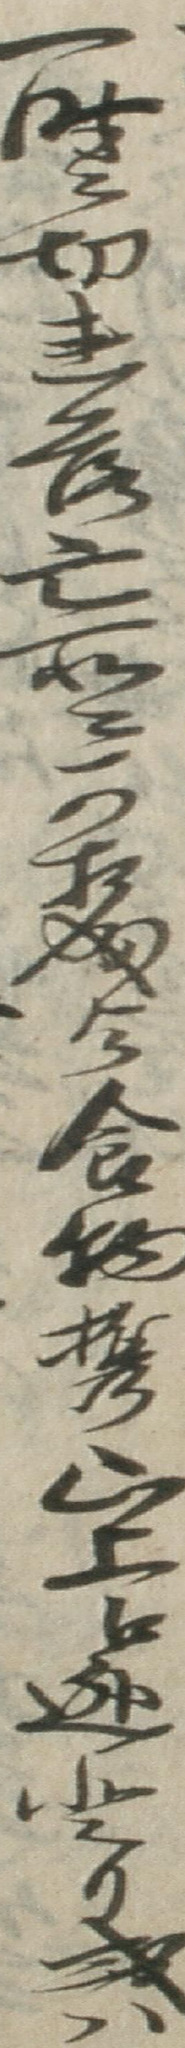一時二切れ落亡所二可相成と食物携山上江逃登り或ハ
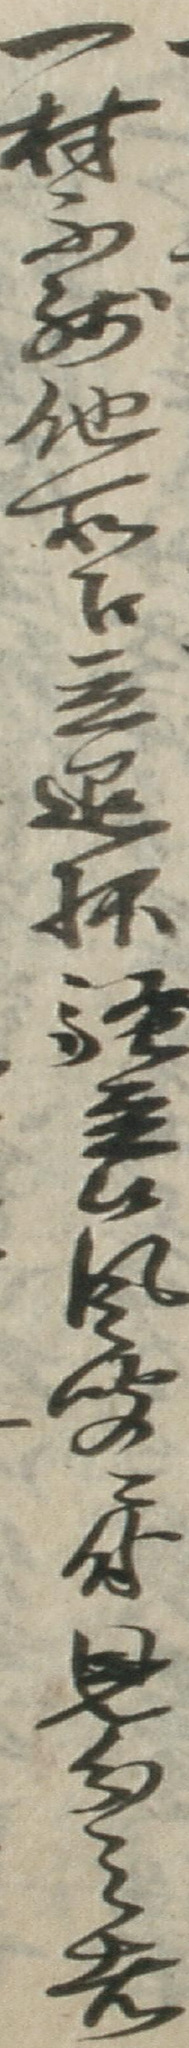一村不残他所江立退抔騒立候風聞二付見分之者
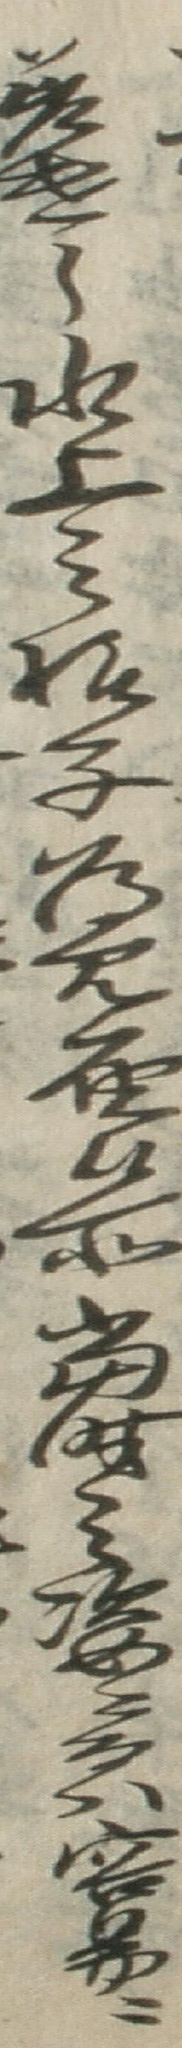差遣し水上之様子為見届候所当時之姿二而ハ容易二
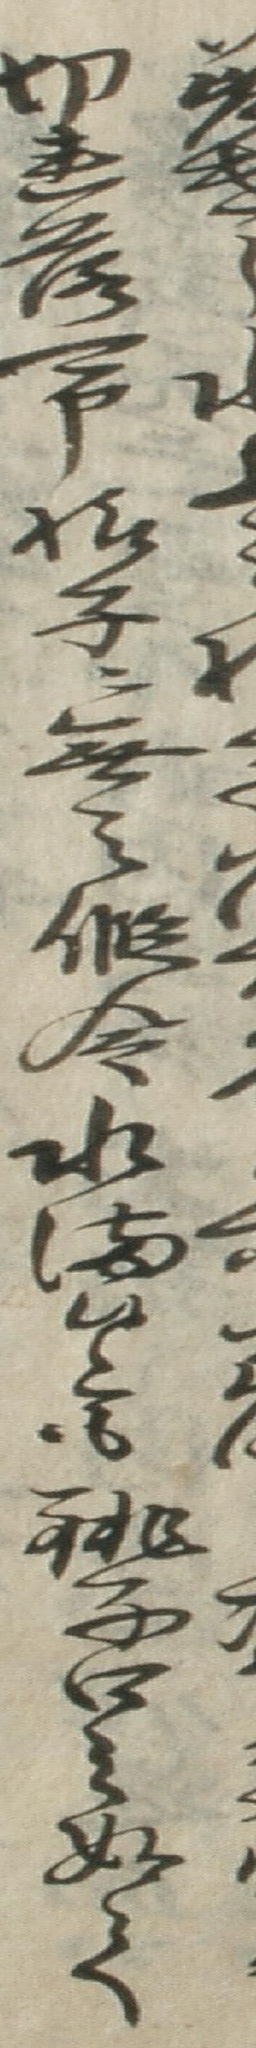切れ落可申様子二無之仮令水満候とも銚子口之如く
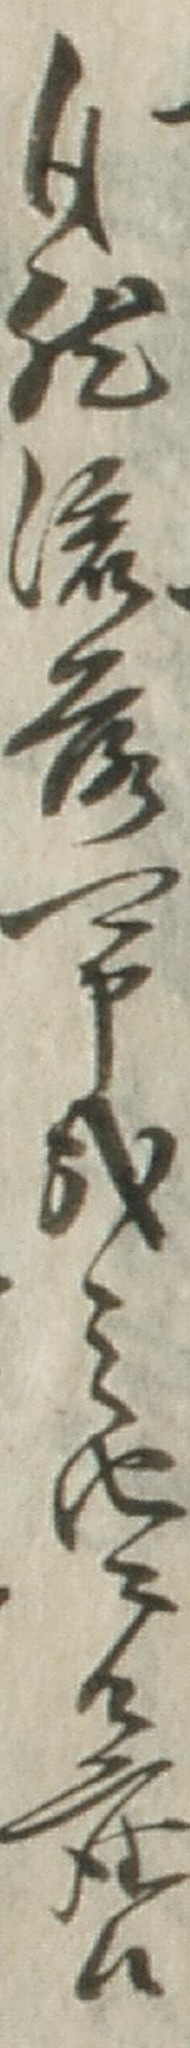自然流落可申哉之由二御座候
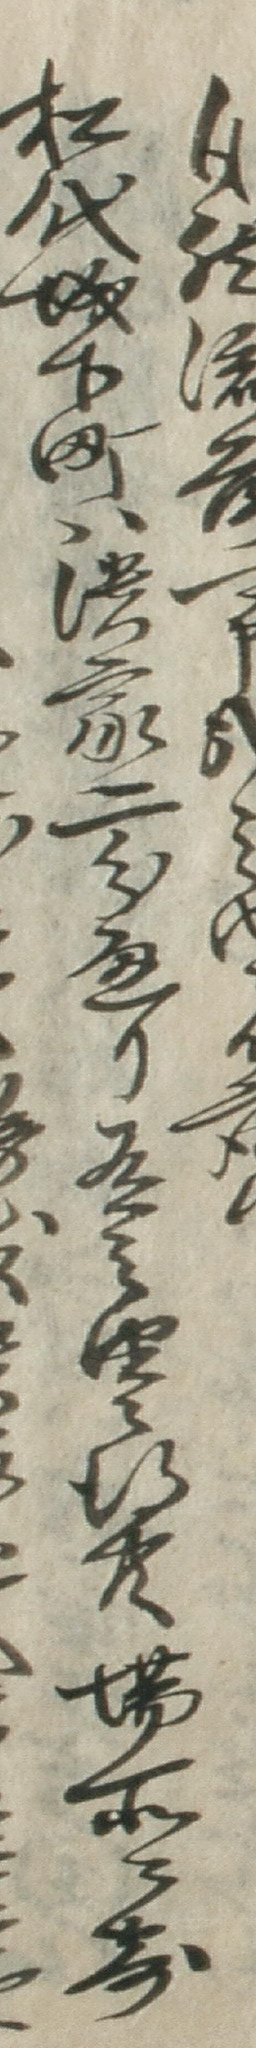一松代城下町ハ潰家二分通り有之由候得共場所二寄
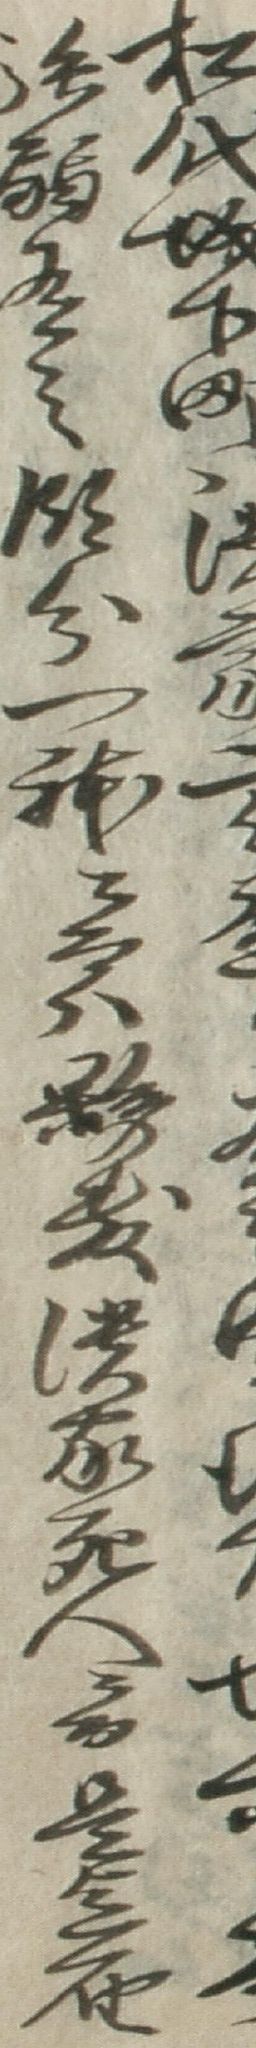強弱有之領分一体二而ハ夥敷潰家死人二而是迄届
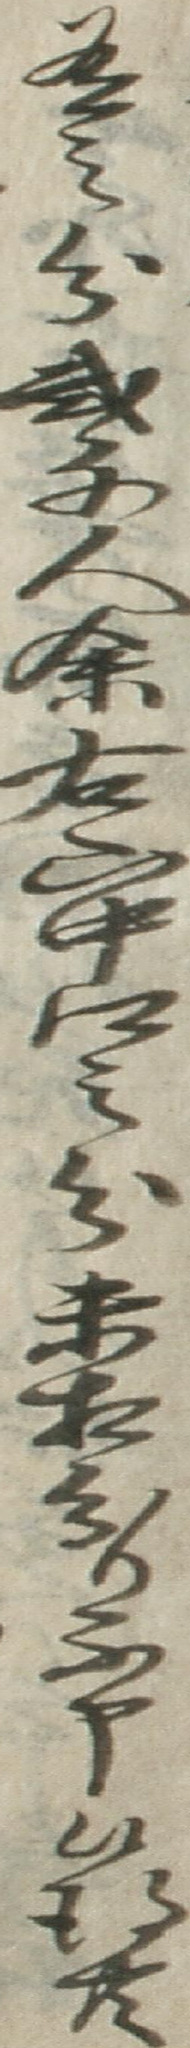有之分弐千人余右山中郷之分未相分り不申候得共
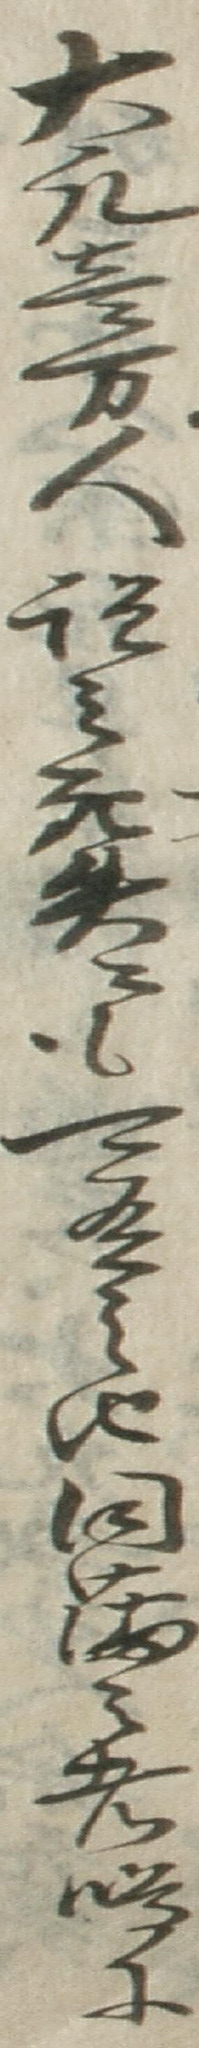大凡壱万人程之死失二も可有之由同藩之者噂に
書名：信濃國地震實録記
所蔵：東京大学地震研究所図書室 Earthquake Research Institute Library, The University of Tokyo, JAPAN
